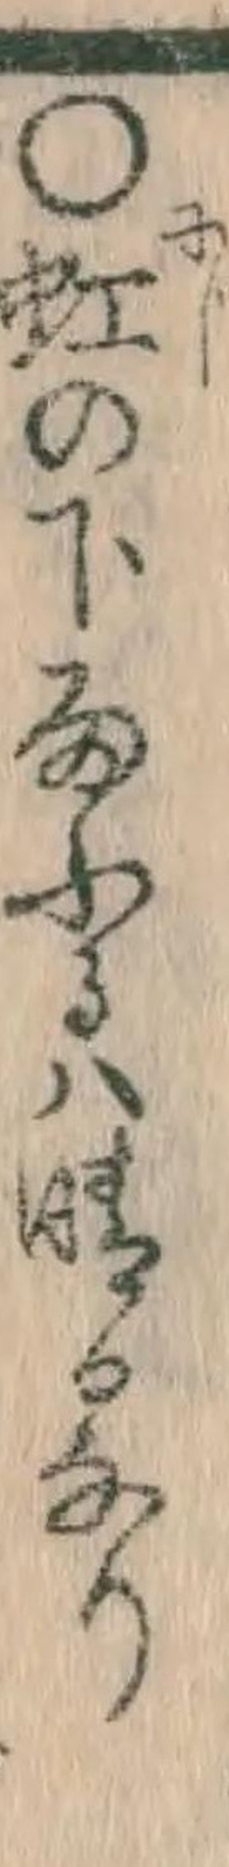○虹の下雨ふるは晴るなり
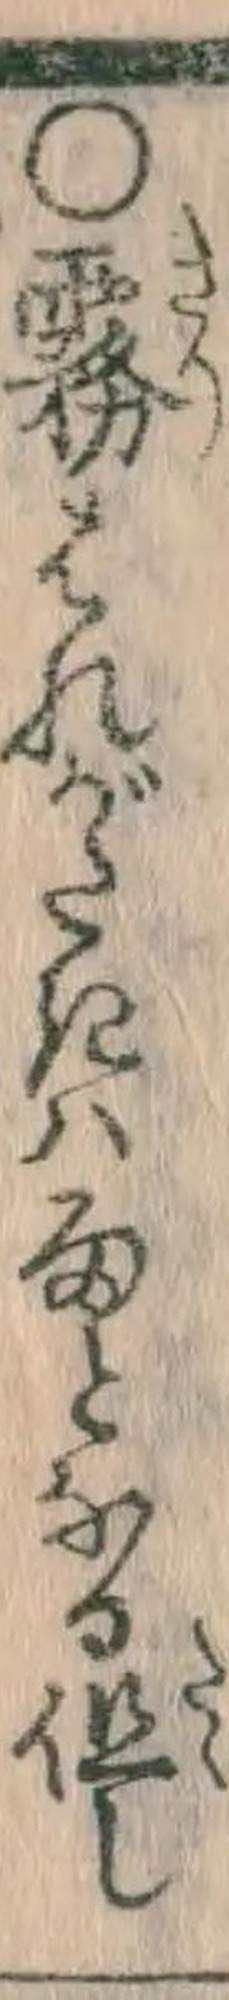○霧はれがたきは雨となる但し
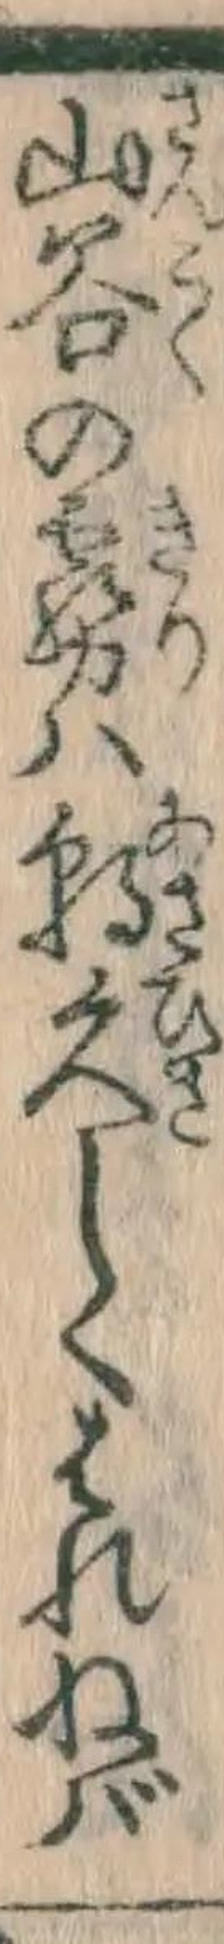山谷の霧は朝久しくはれねば
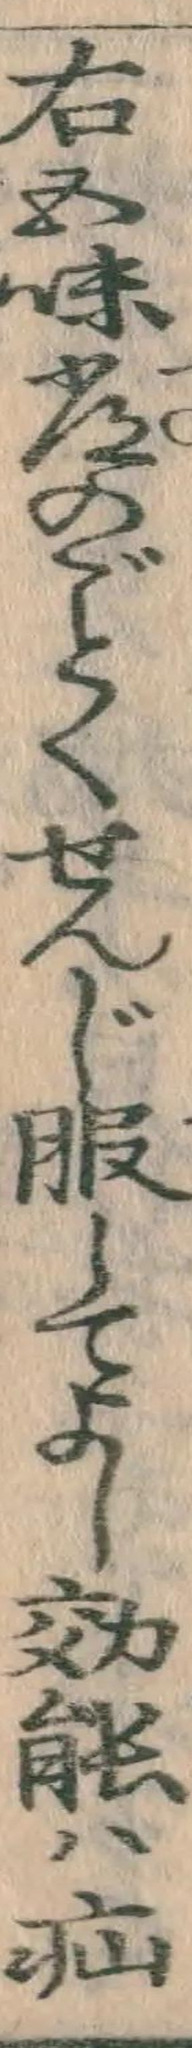右五味常のごとくせんじ服してよし効能は疝
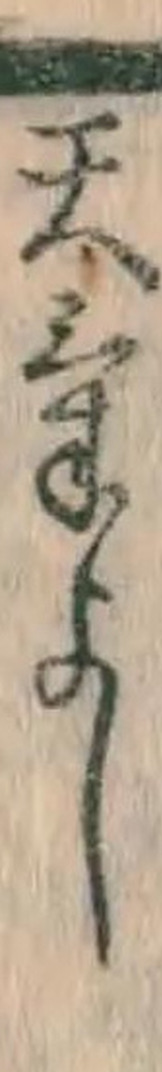天気よし
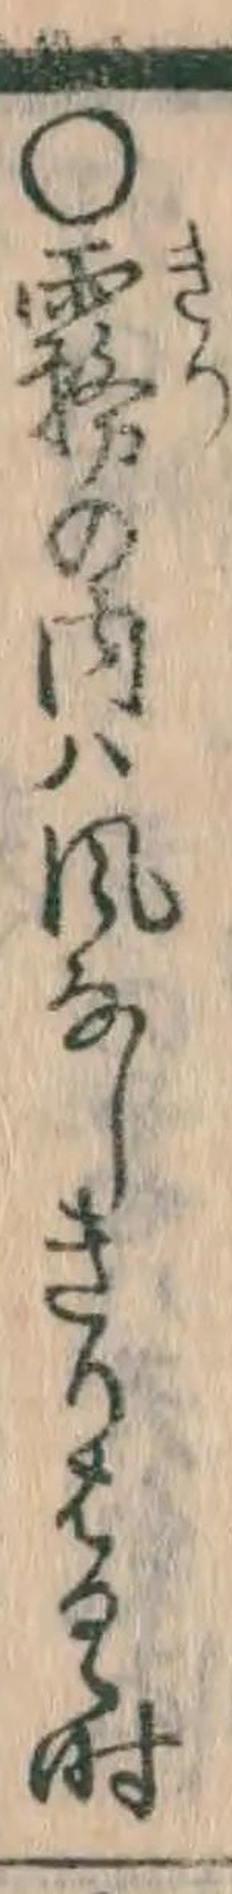○霧の内は風なしきりはるゝ時
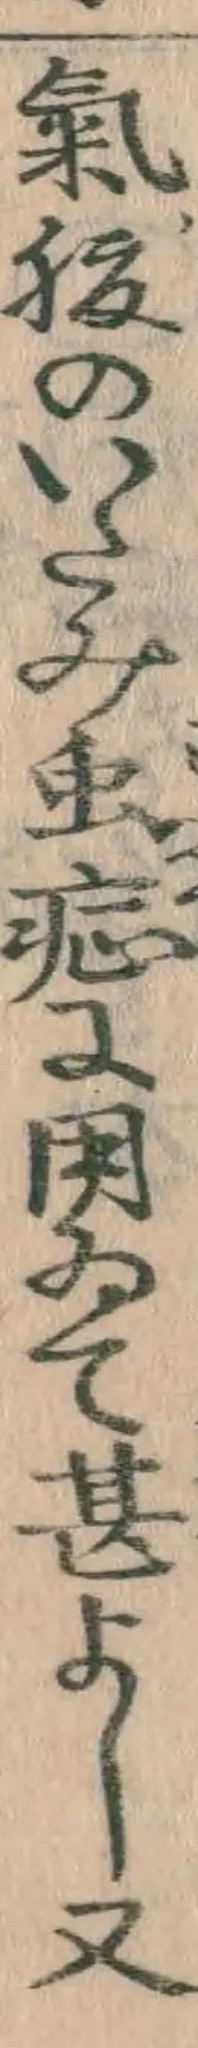気腹のいたみ虫症に用ゐて甚よし又
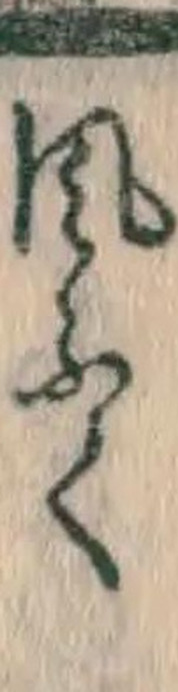風ふく
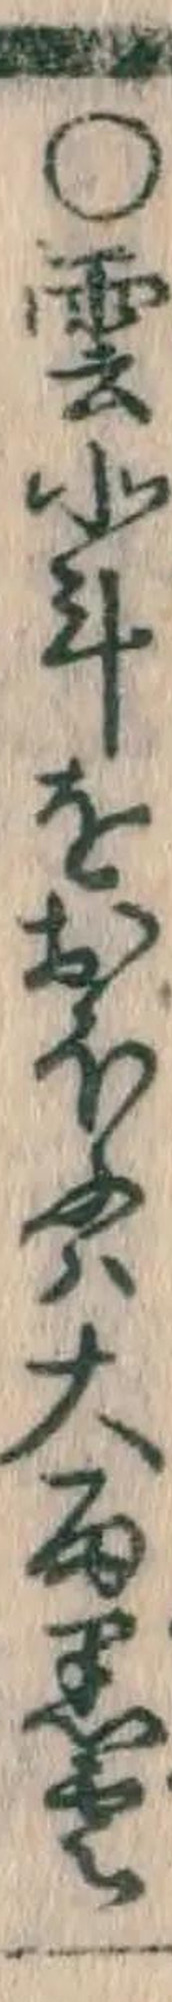○雲北斗をおほふは大雨黒雲
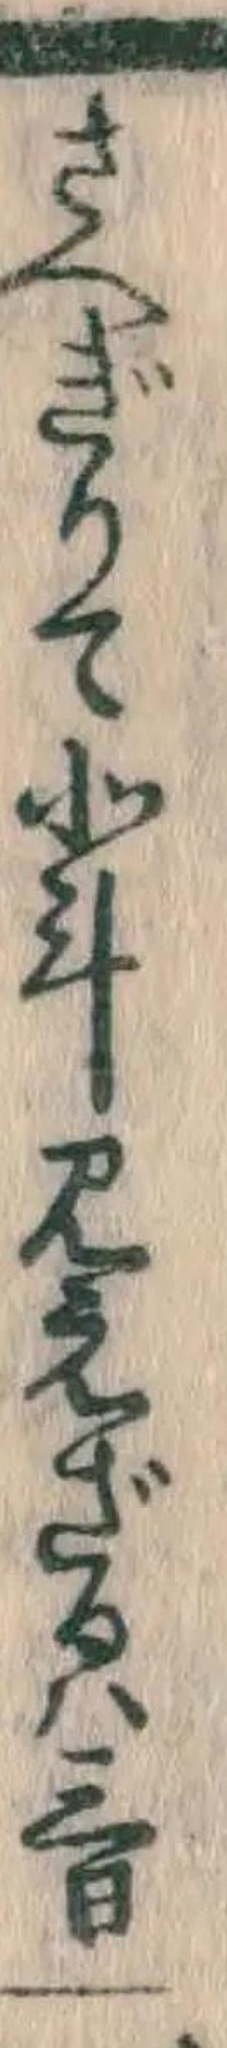さへぎりて北斗見えざるは三日
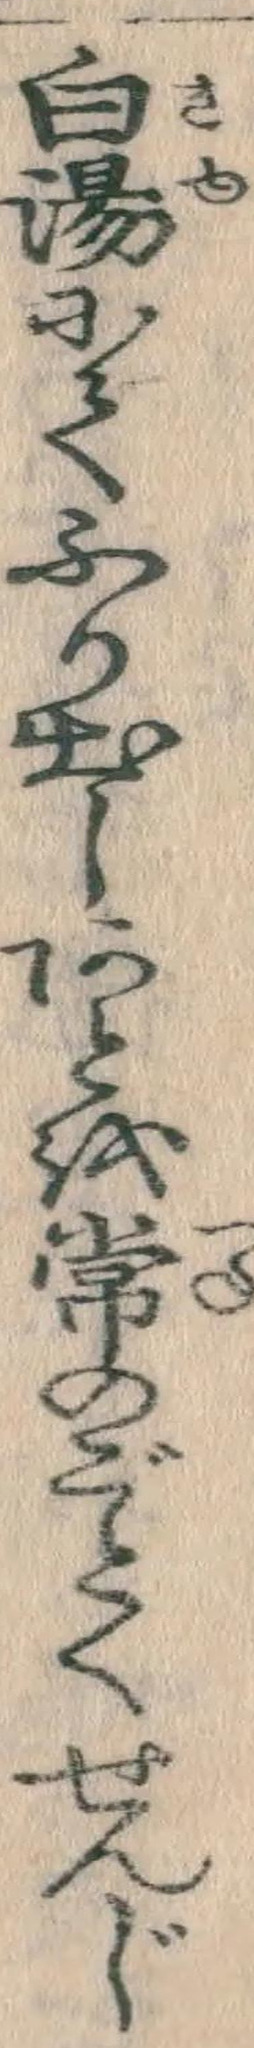白湯にてふり出しあとを常のごとくせんじ
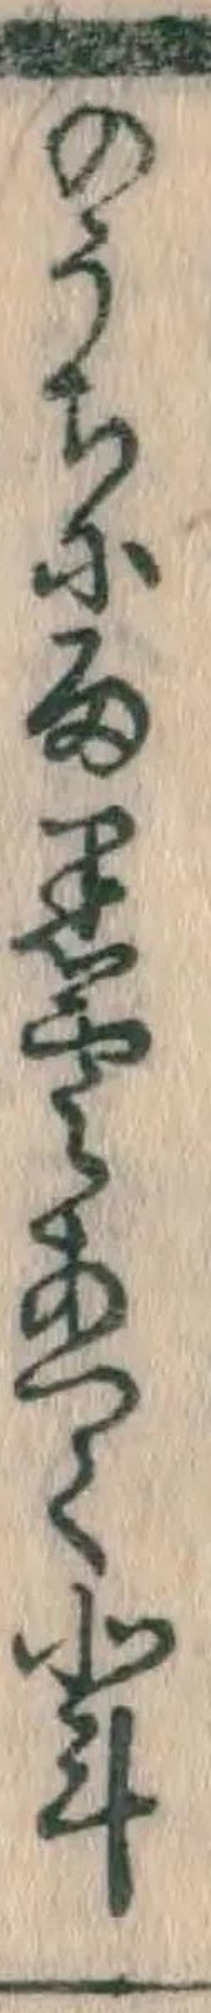のうちに雨黒雲あつく北斗
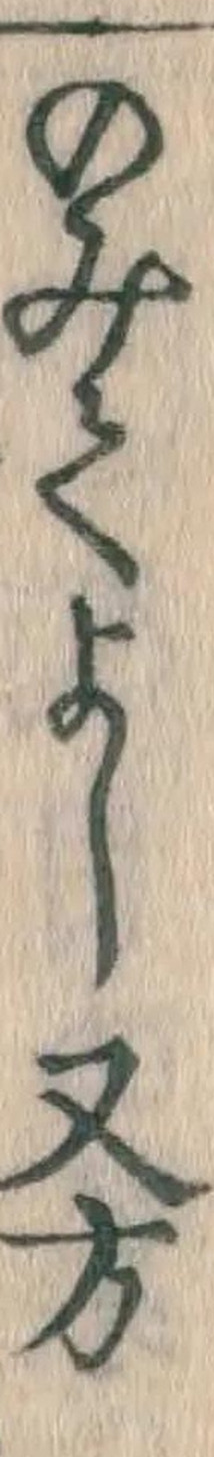のみてよし又方
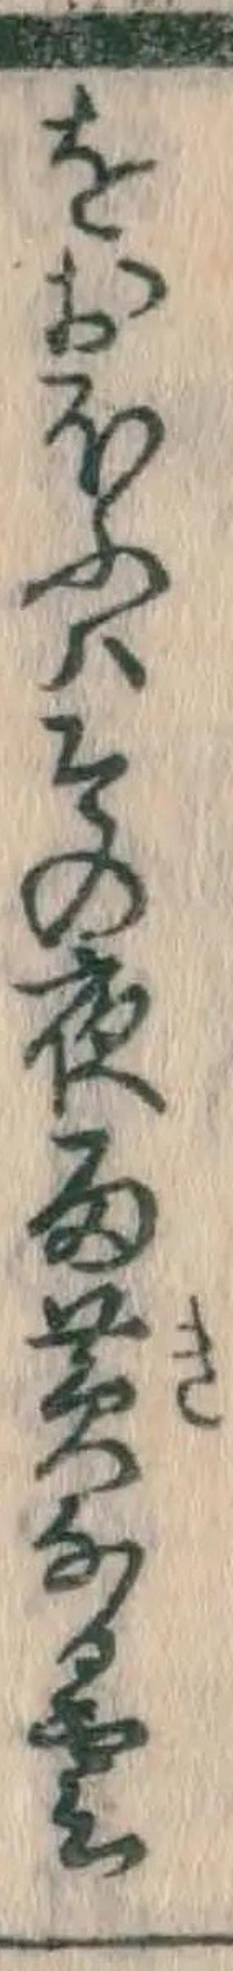をおほふはその夜雨黄なる雲
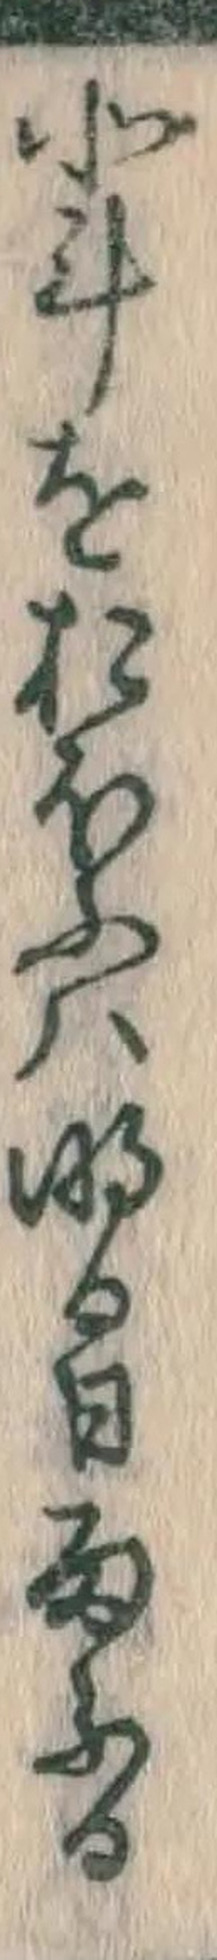北斗をおほふは明る日雨ふる
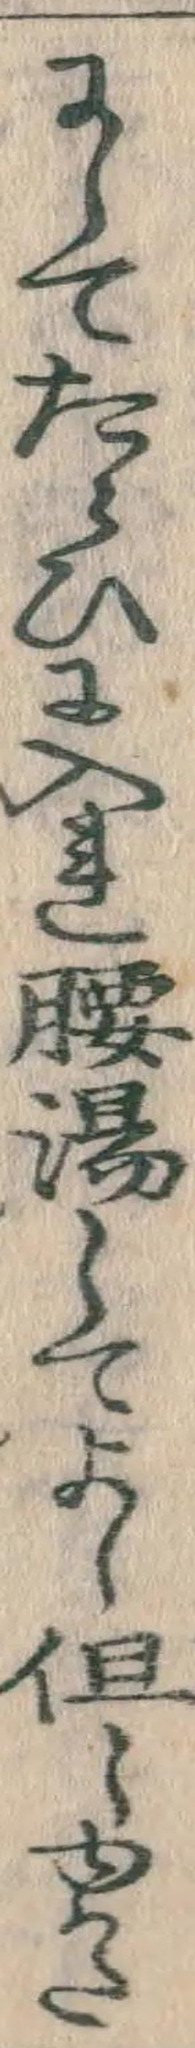にしてたらひに入れ腰湯してよし但しゆかた
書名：広益秘事大全 3巻. [4]
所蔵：国立国会図書館 National Diet Library, JAPAN
